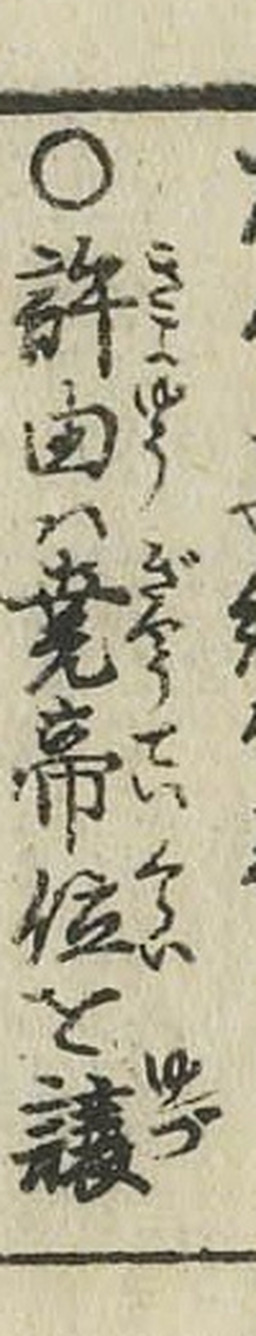○許由は尭帝位を譲
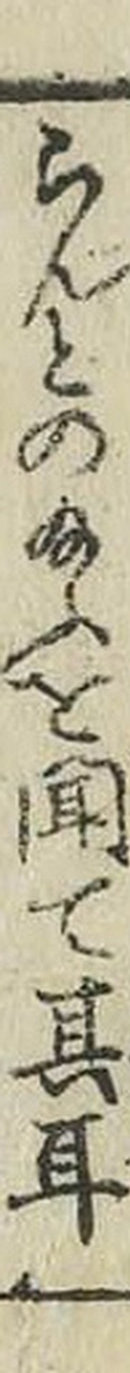らんとの給ふを聞て其耳
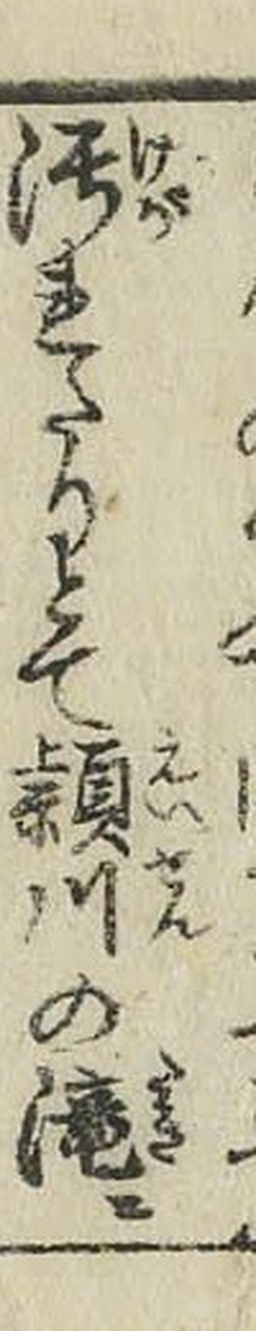汚れたりとて潁川の滝に
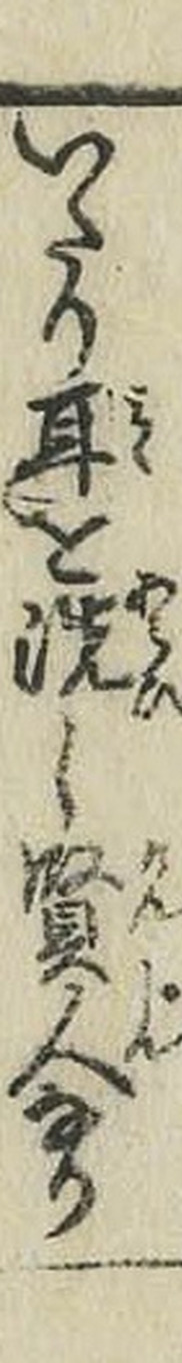いたり耳を洗し賢人なり

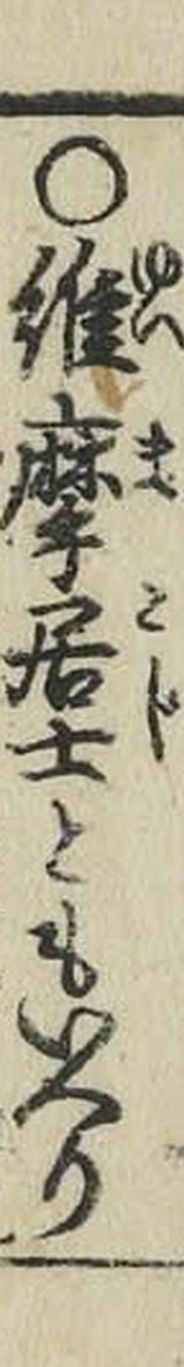○維摩居士ともいへり
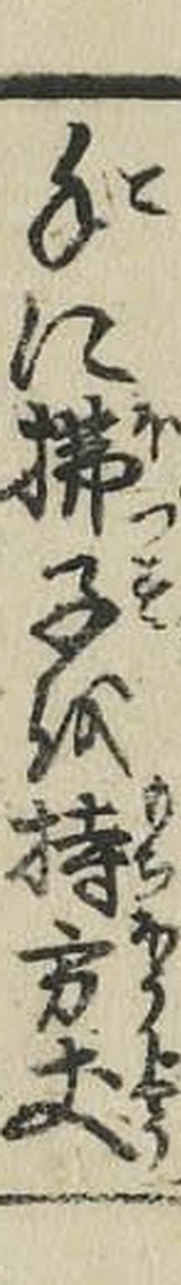手に払子を持方丈
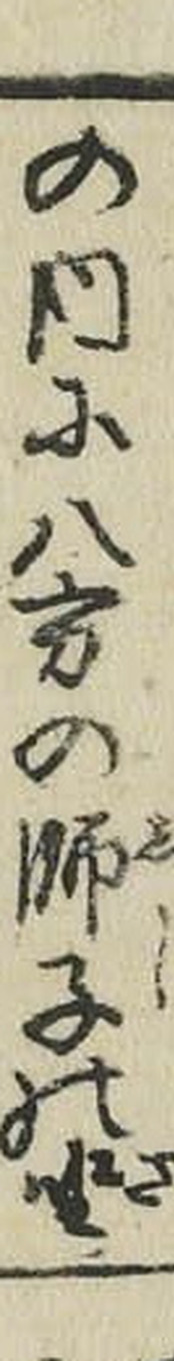の門に八方の獅子の座
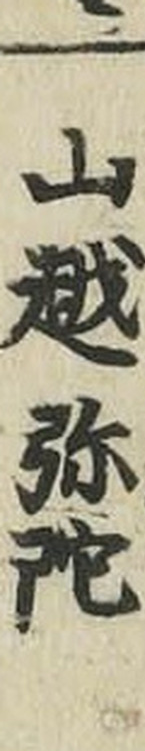山越弥陀
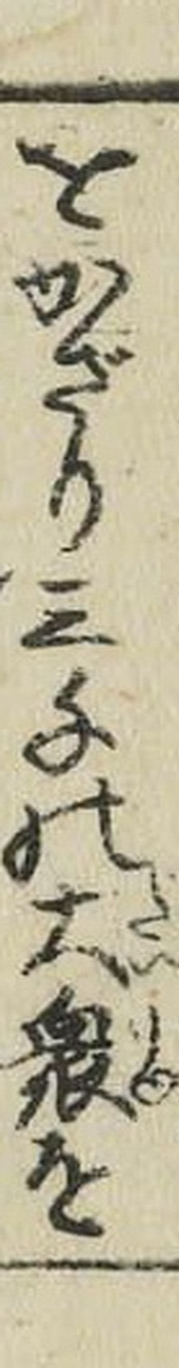をかざり三千の大衆を
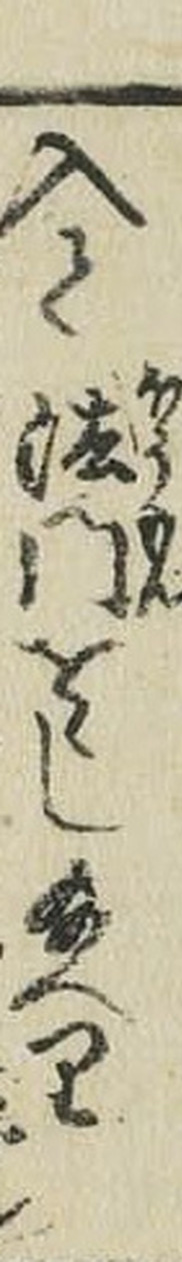入て法門をゝし給へり
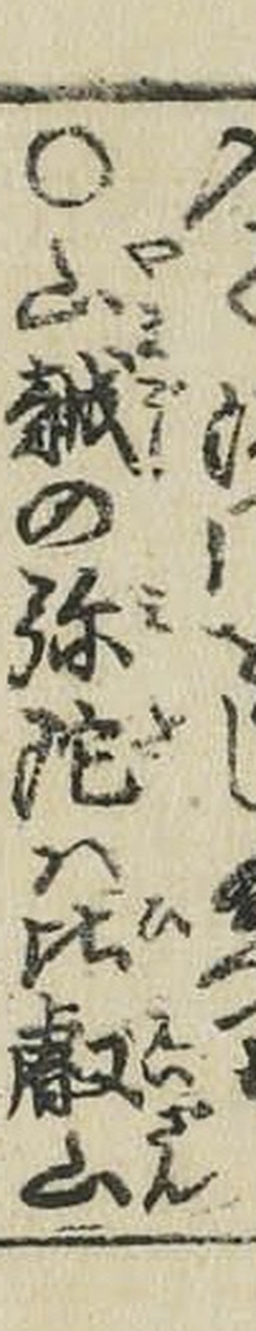○山越の弥陀は比叡山
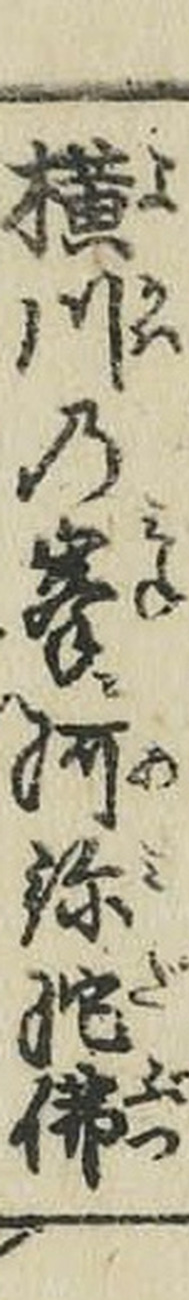横川の峯に阿弥陀仏
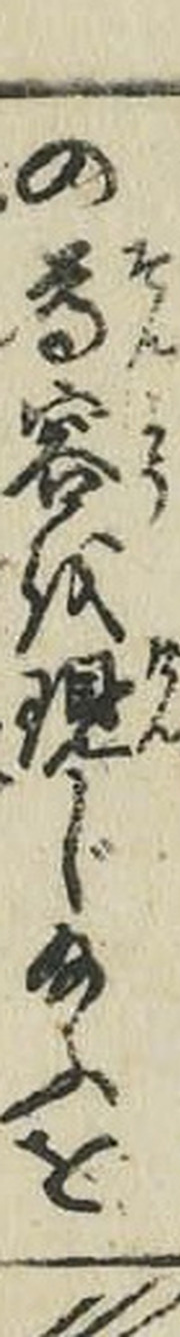の尊容を現じ給ふを
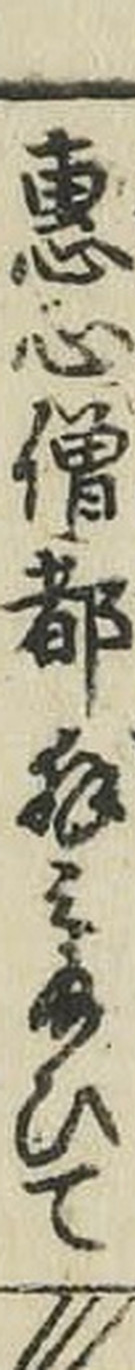恵心僧都拝み給ひて
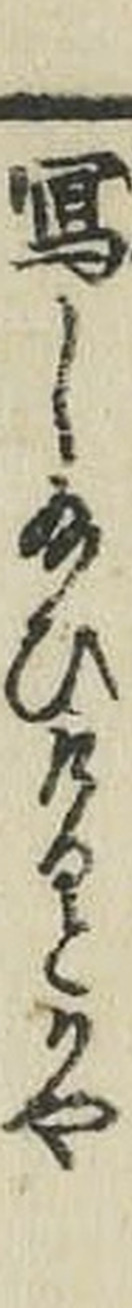写し給ひけるとかや
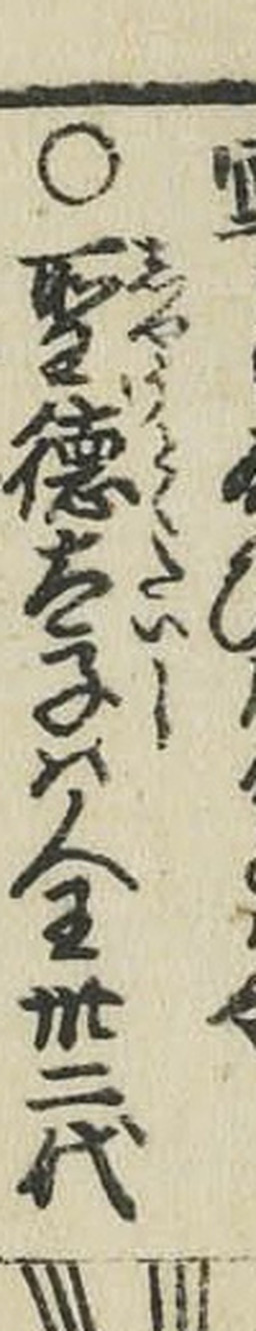○聖徳太子は人王丗二代
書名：増補頭書訓蒙図彙大成 10巻 10:巻之21
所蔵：東京学芸大学教育コンテンツアーカイブ
